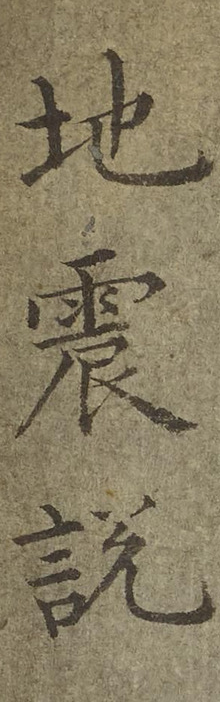地震学

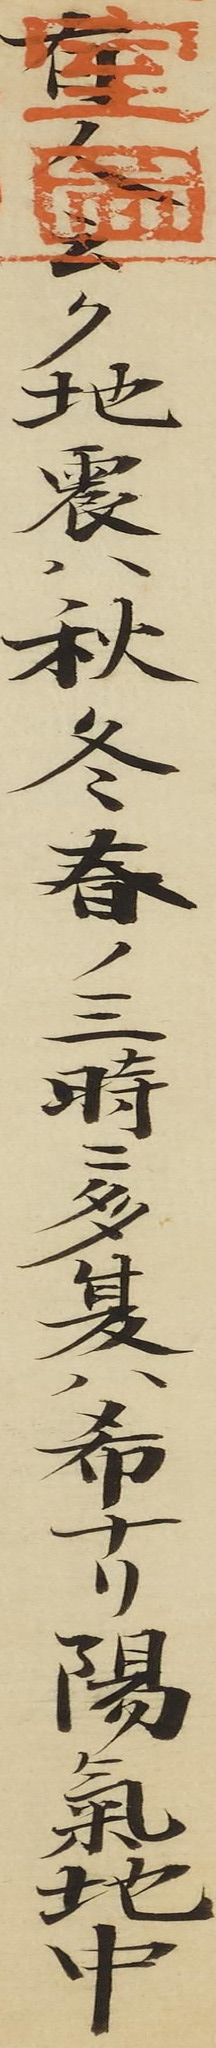有人云ク地震ハ秋冬春ノ三時ニ多夏ハ希ナリ陽気地中
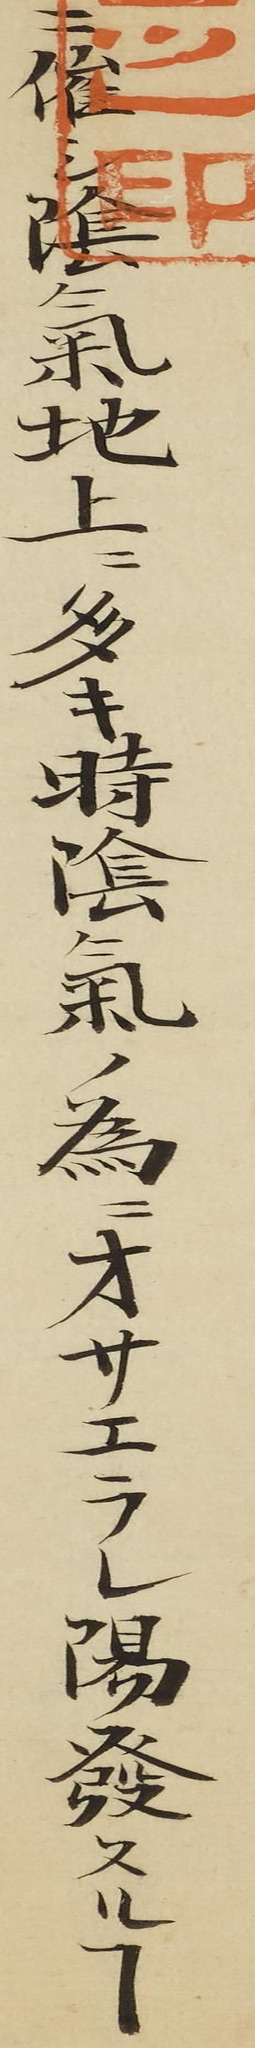ニ催シ陰気地上ニ多キ時陰気ノ為ニオサエラレ陽発スルコト
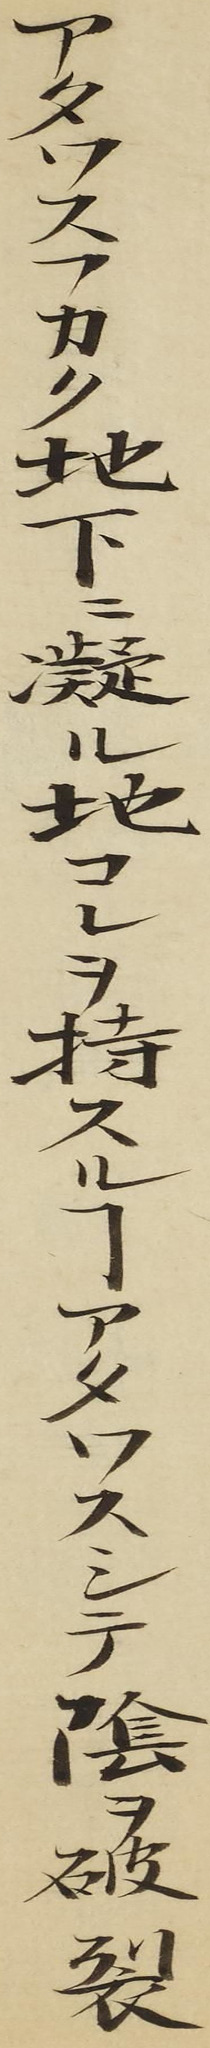アタワスフカク地下ニ凝ル地コレヲ持スルコトアタワスシテ陰ヲ破裂
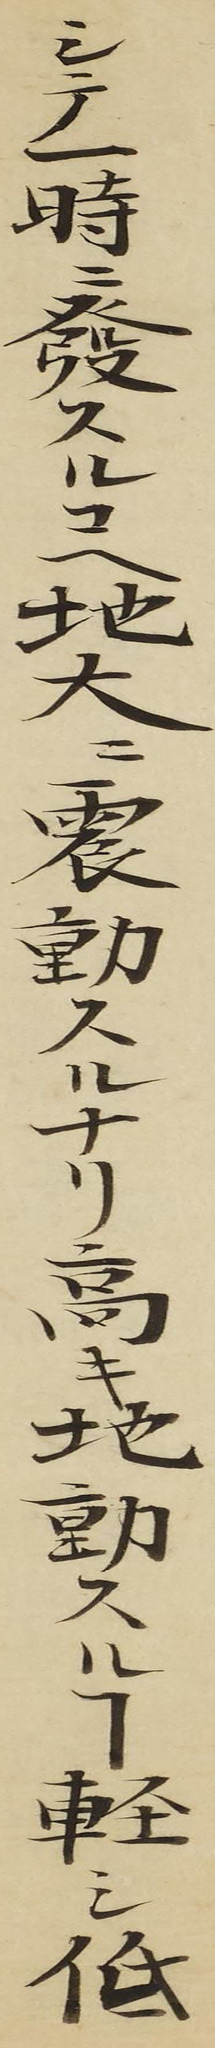シテ一時ニ発スルコヘ地大ニ震動スルナリ高キ地動スルコト軽シ低
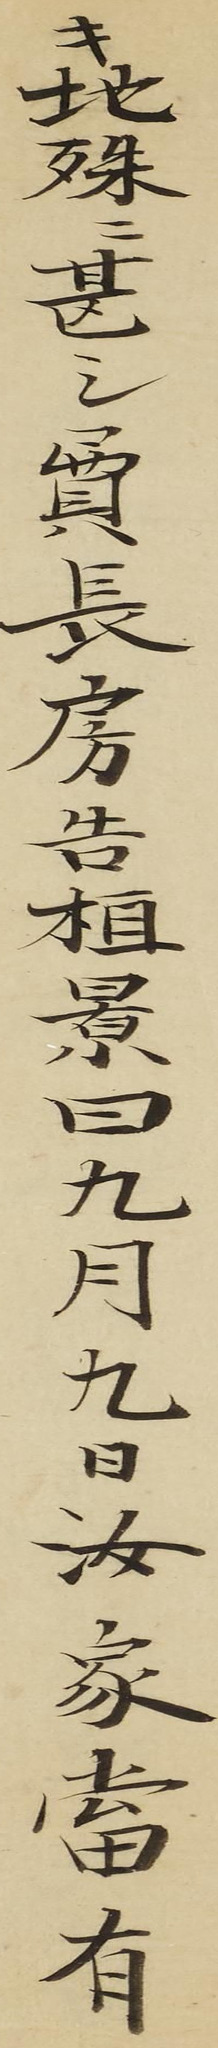キ地殊ニ甚シ費長房告桓景曰九月九日汝家当有
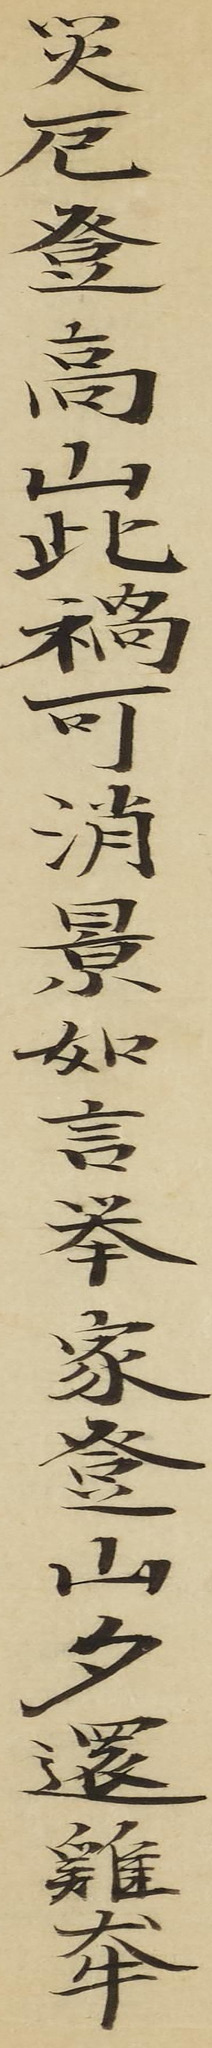災厄登高山此禍可消景如言挙家登山夕還鶏犬牛
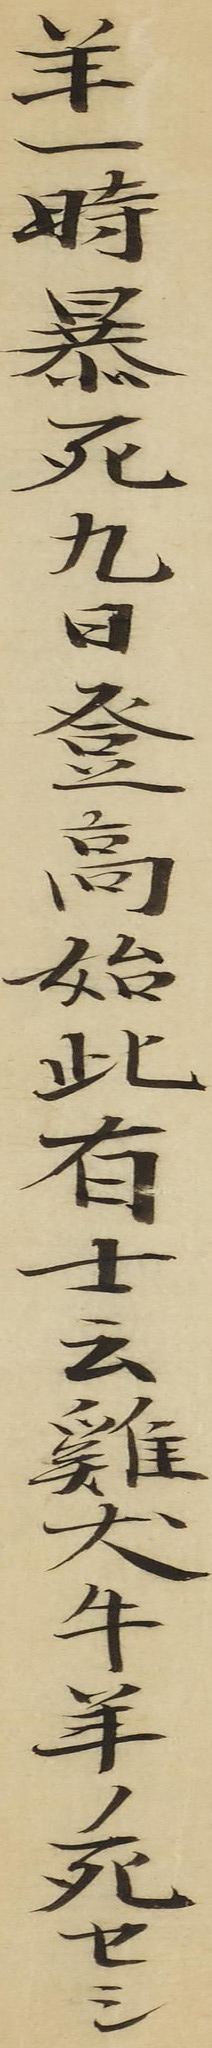羊一時暴死九日登高始此有士云鶏犬牛羊ノ死セシ
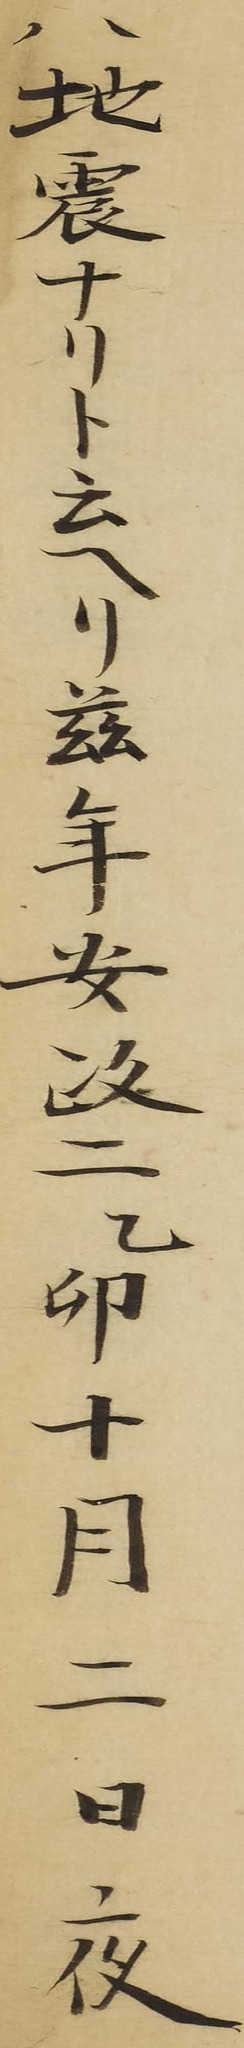ハ地震ナリト云ヘリ茲年安政ニ乙卯十月二日夜

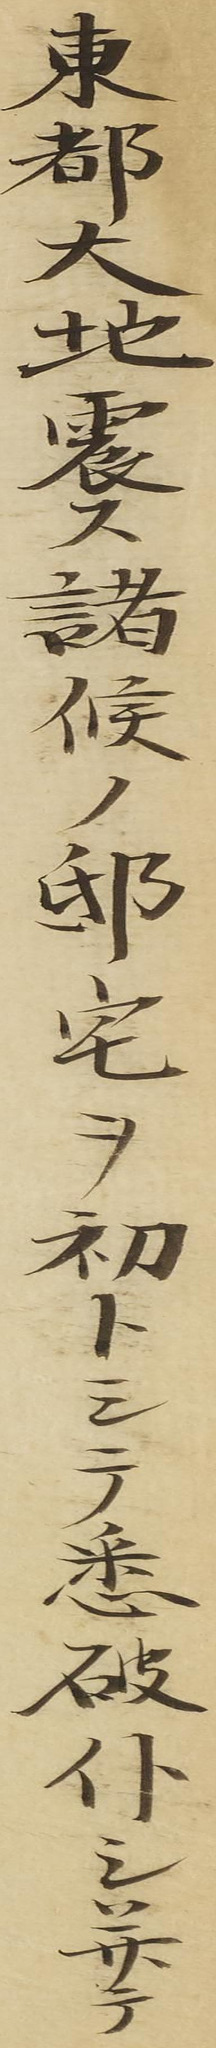東都大地震ス諸候ノ邸宅ヲ初トシテ悉破仆シ幷テ
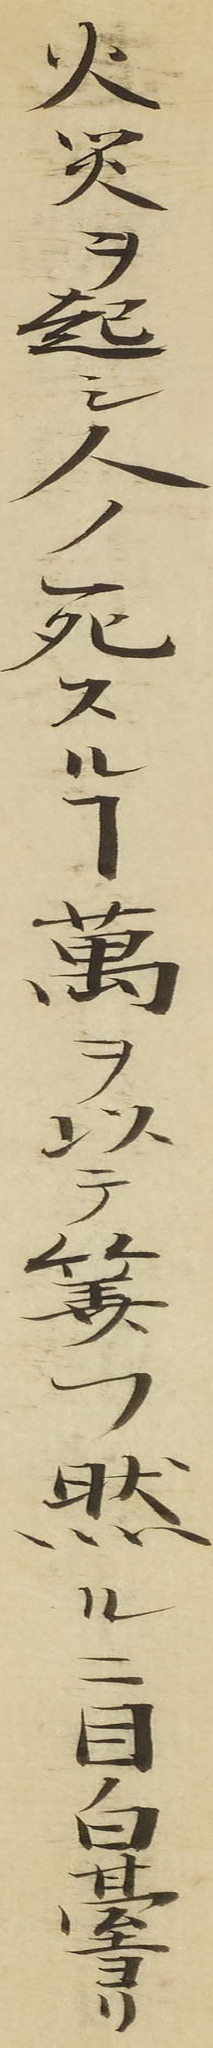火災ヲ起シ人ノ死スルコト万ヲ以テ算フ然ルニ目白台ヨリ
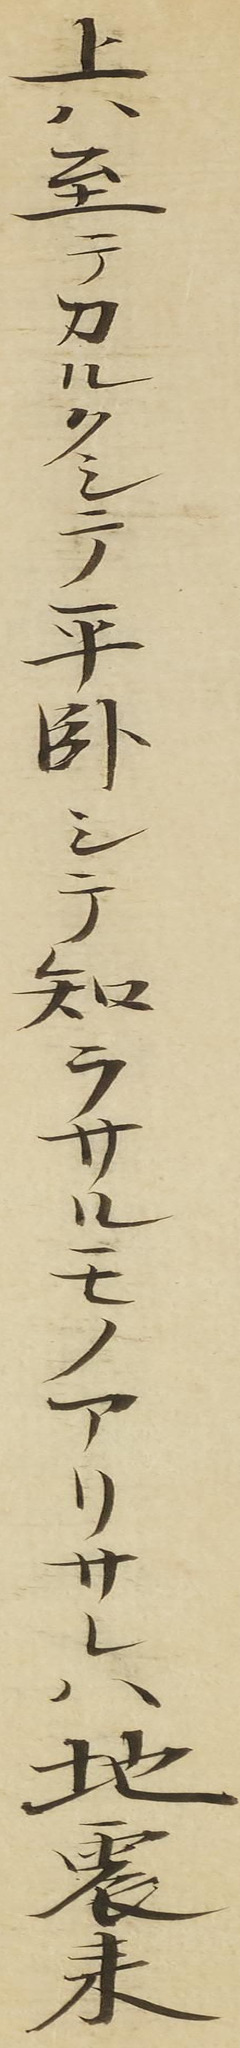上ハ至テカルクシテ平臥シテ知ラサルモノアリサレハ地震来
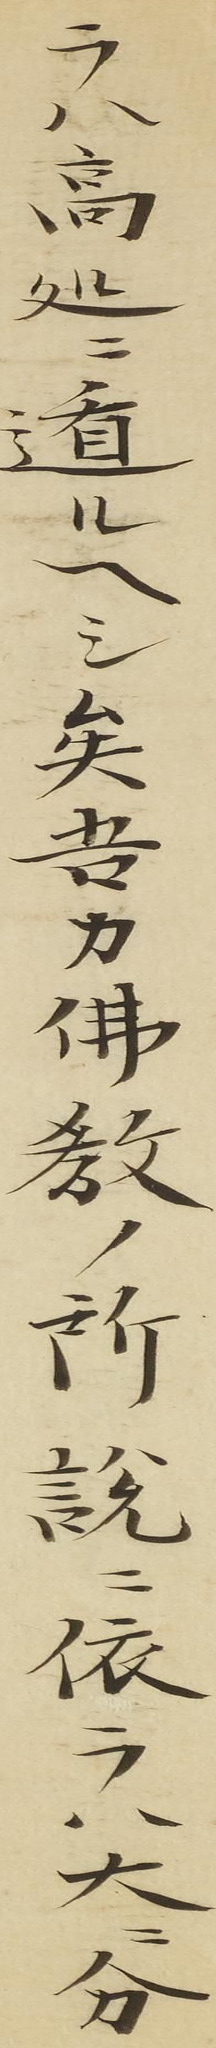ラハ高処ニ遁ルヘシ矣吾カ仏教ノ所説ニ依ラハ大ニ分
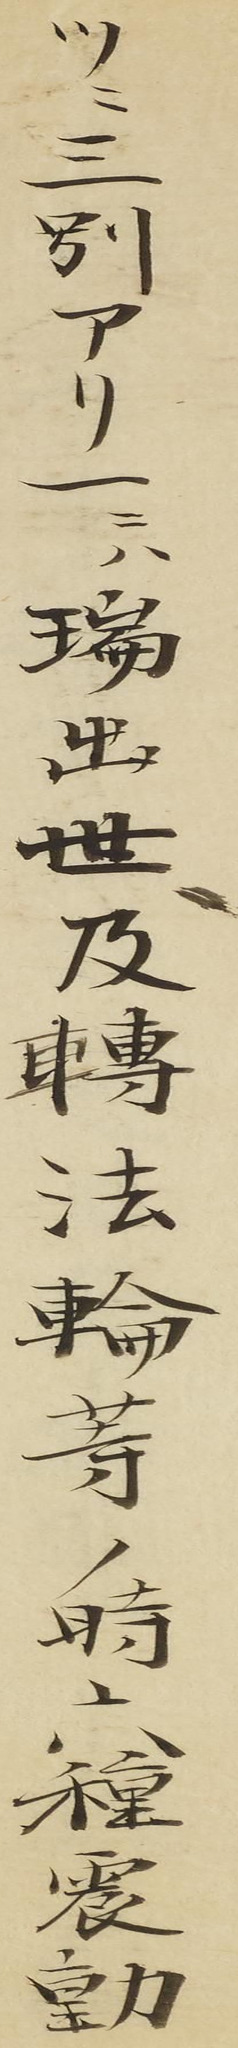ツニ三別アリ一ニハ瑞出世及転法輪等ノ時六種震動
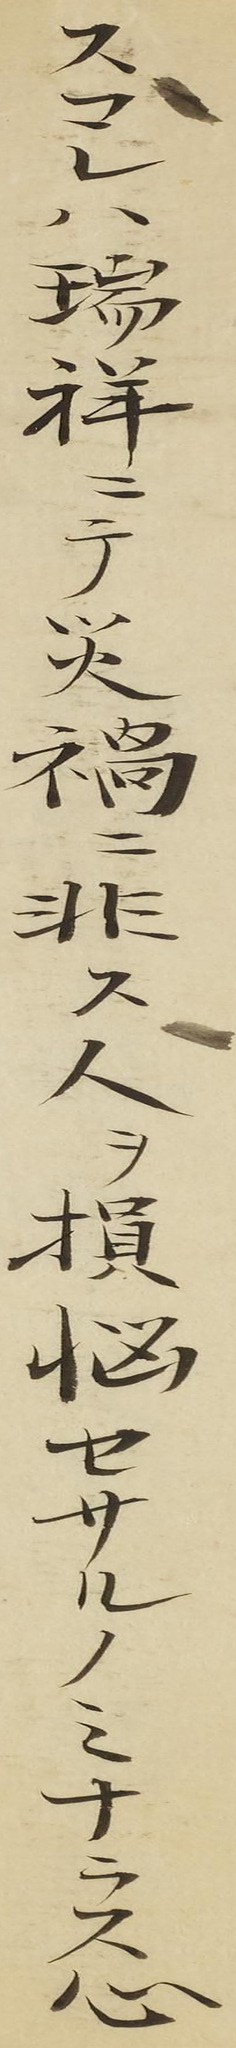スコレハ瑞祥ニテ災禍ニ非ス人ヲ損悩セサルノミナラス心
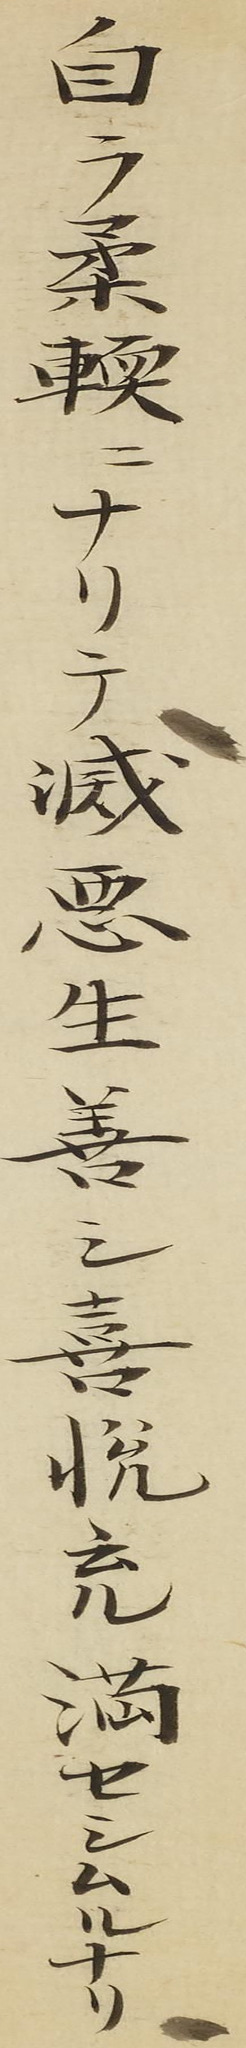自ラ柔軟ニナリテ滅悪生善シ喜悦充満セシムルナリ
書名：地震説　鶴高山善仁寺天柗老人著述　全
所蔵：東京大学地震研究所図書室 Earthquake Research Institute Library, The University of Tokyo, JAPAN
